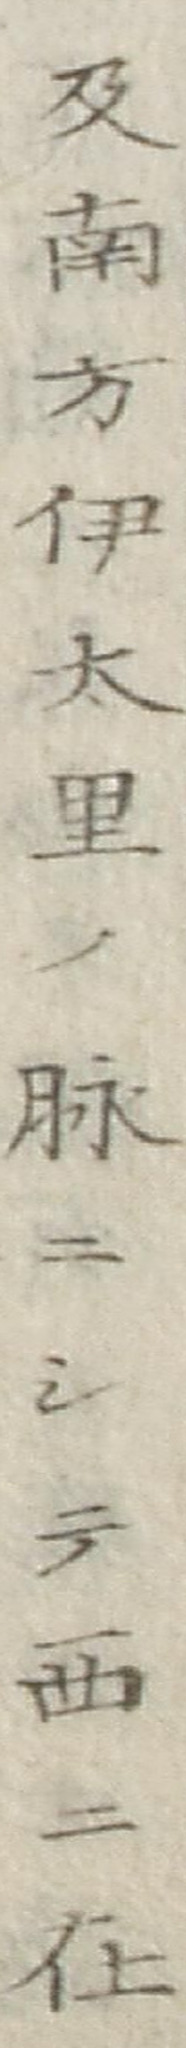及南方伊太里ノ脉ニシテ西ニ在
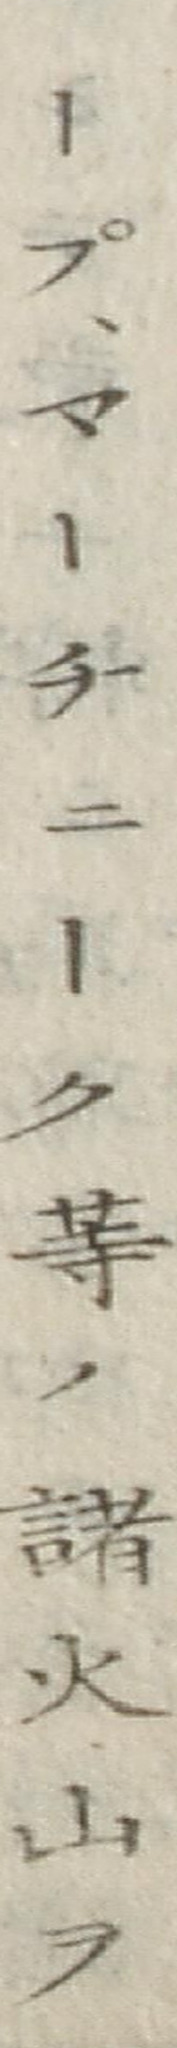ープ、マーチニーク等ノ諸火山ヲ
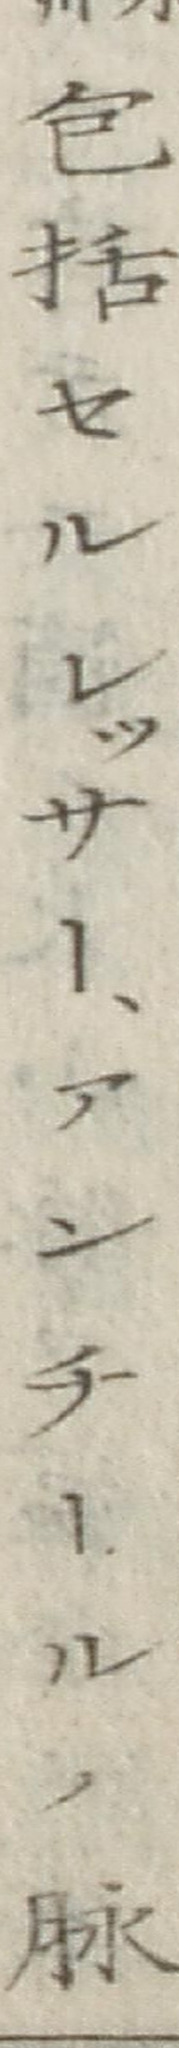包括セルレッサー、アンチールノ脉
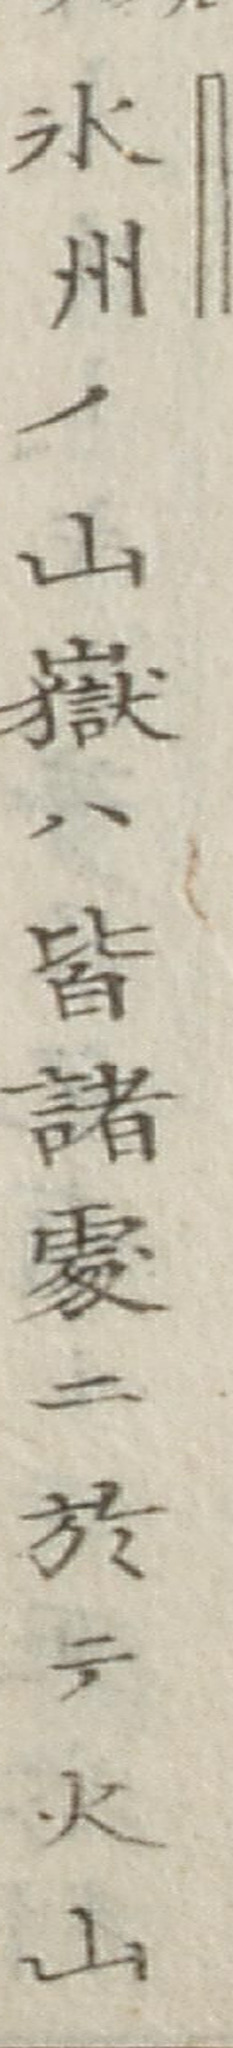氷州ノ山嶽ハ皆諸處ニ於テ火山
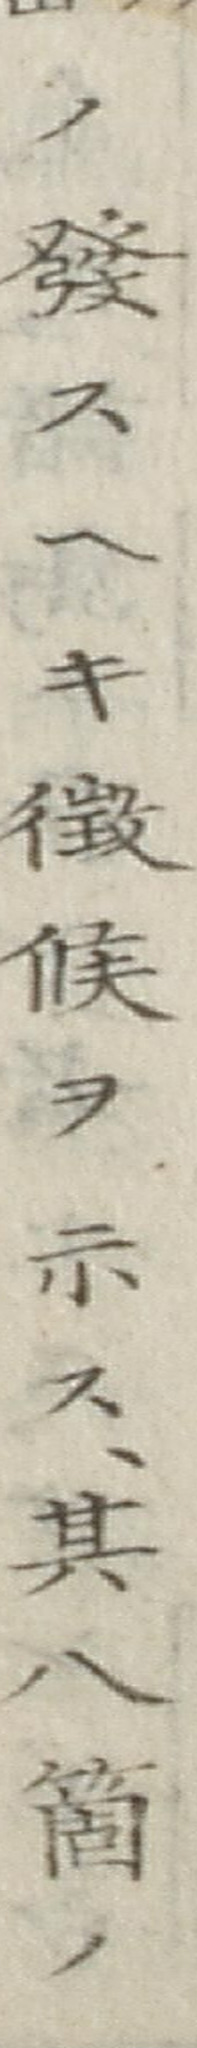ノ發スヘキ徴候ヲ示ス、其八箇ノ
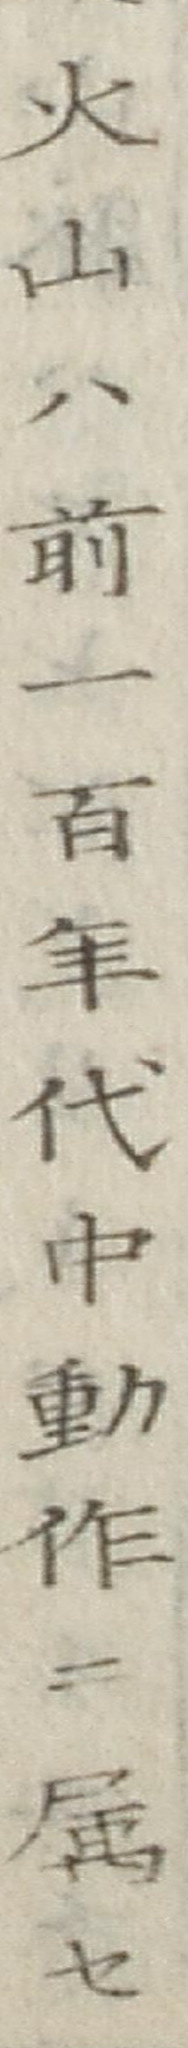火山ハ前一百年代中動作ニ属セ
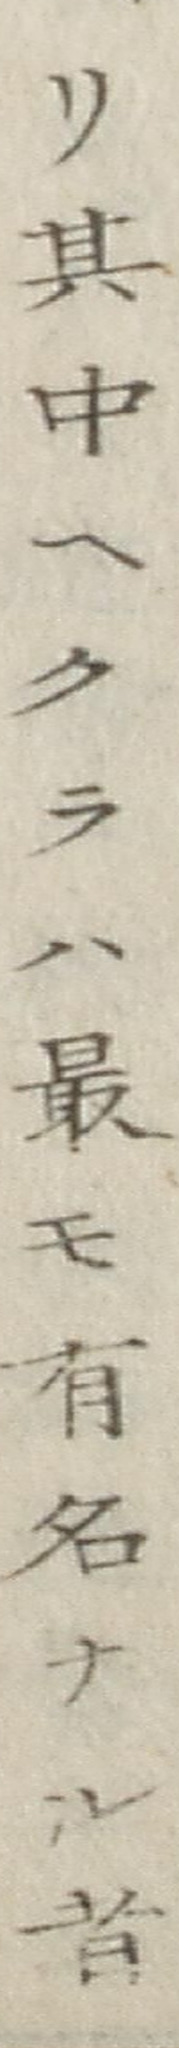リ其中ヘクラハ最モ有名ナル者
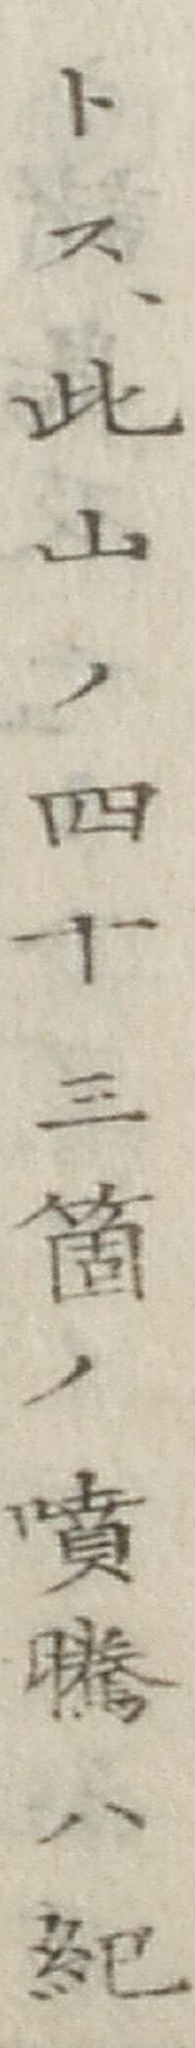トス、此山ノ四十三箇ノ噴騰ハ紀
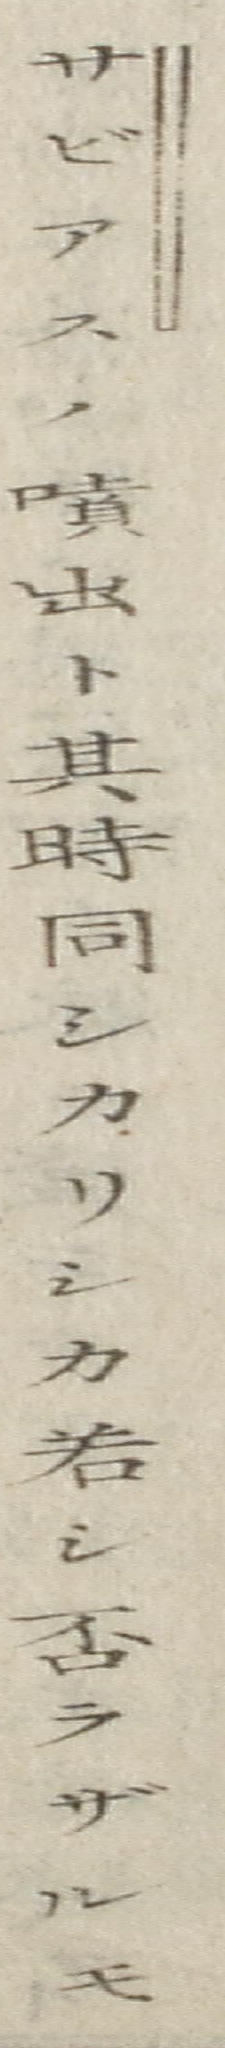サビアスノ噴出ト其時同シカリシカ若シ否ラザルモ
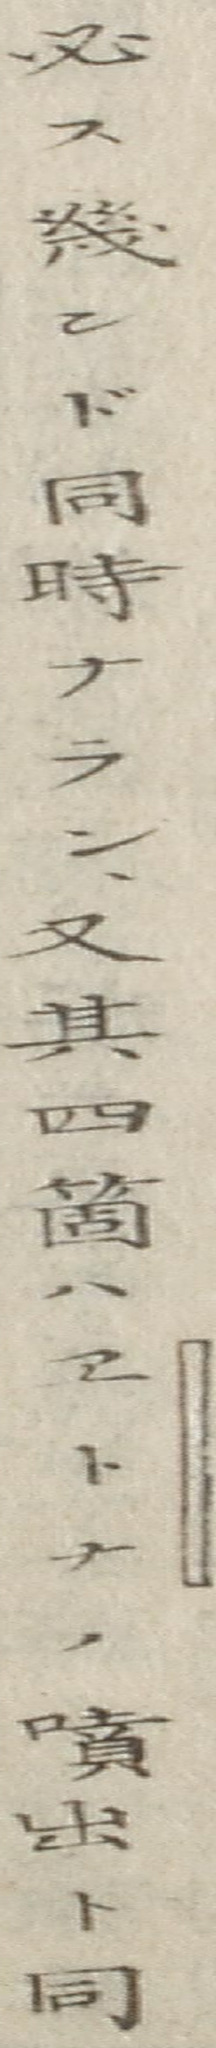必ズ幾ンド同時ナラン、又其四箇ハヱトナノ噴出ト同
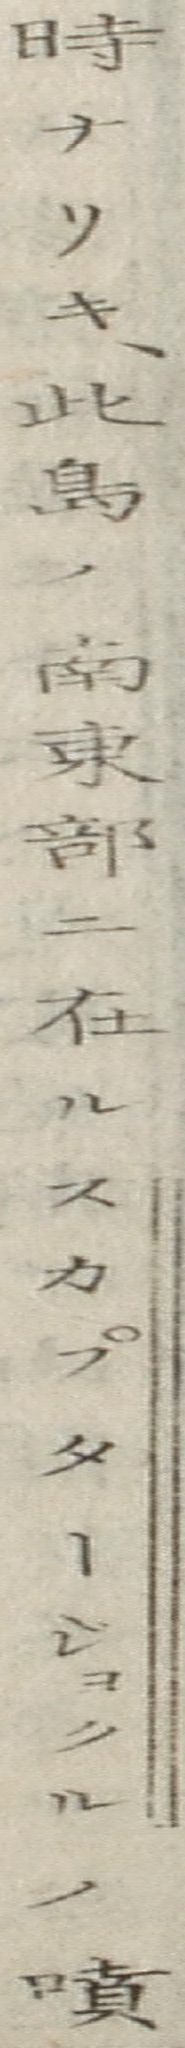時ナリキ、此島ノ南東部ニ在ルスカプターショクルノ噴
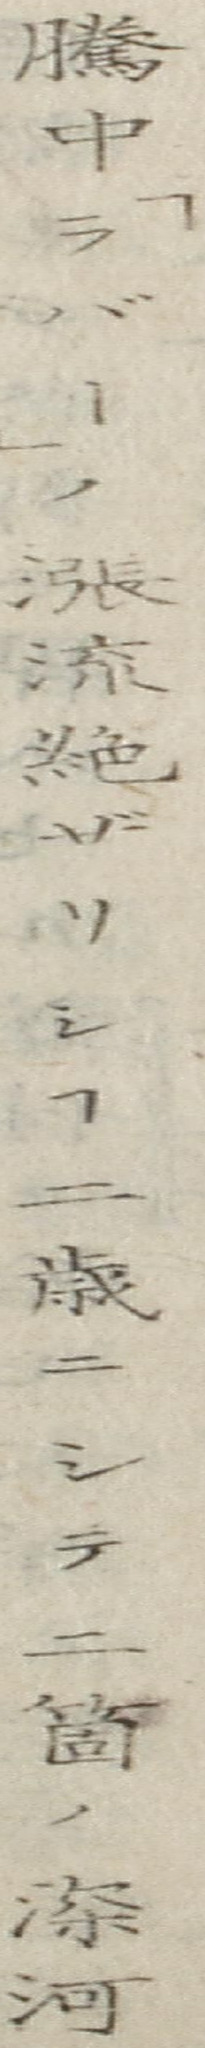騰中「ラバー」ノ漲流絶ザリシヿニ歳ニシテ二箇ノ深河
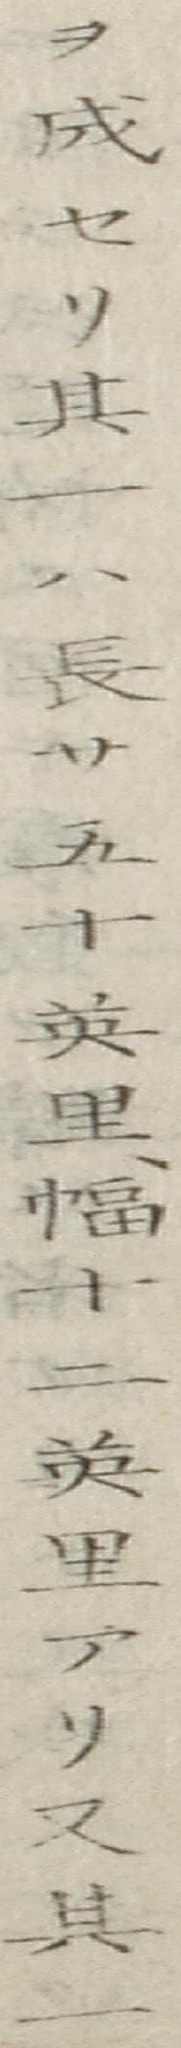ヲ成セリ其一ハ長サ五十英里、幅十二英里アリ又其一
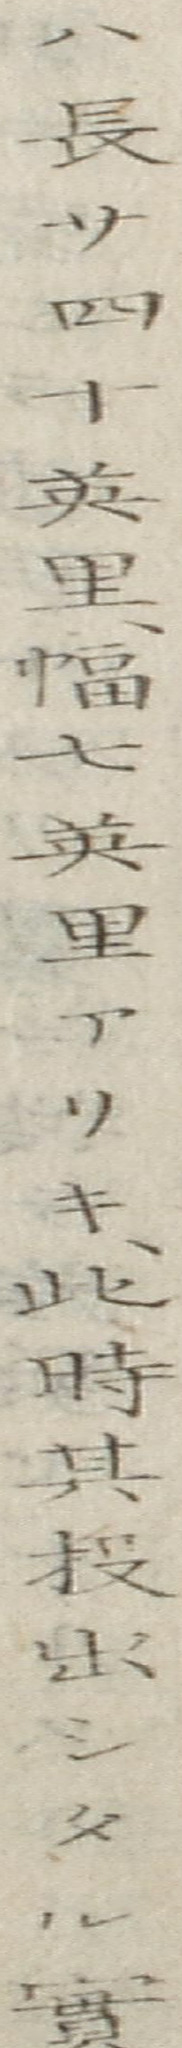ハ長サ四十英里、幅七英里アリキ、此時其投出シタル實
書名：地形論　巻二
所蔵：東京大学地震研究所図書室 Earthquake Research Institute Library, The University of Tokyo, JAPAN
